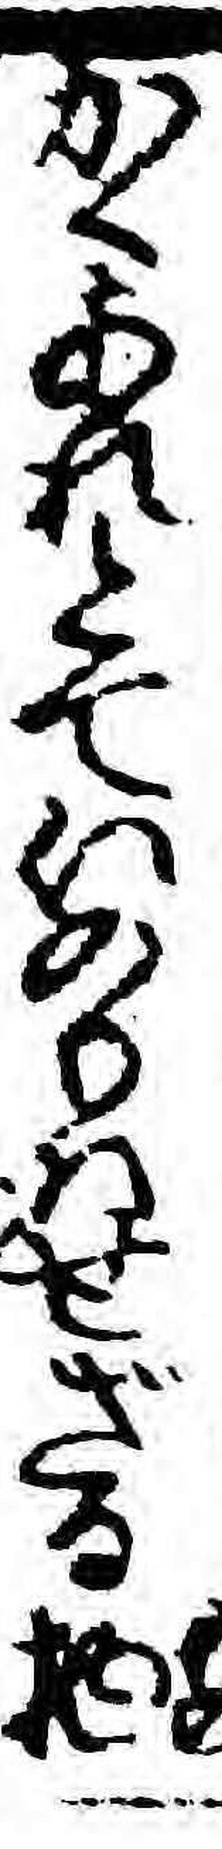かくあれとていのりはせざる物
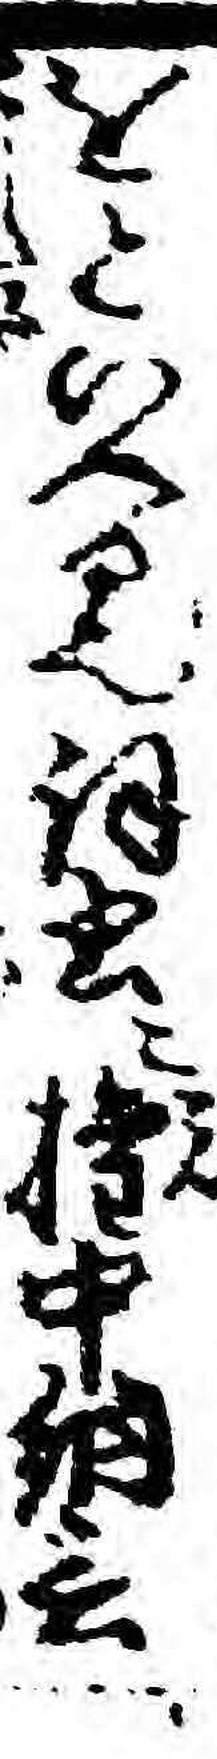をといへる也詞書に権中納言
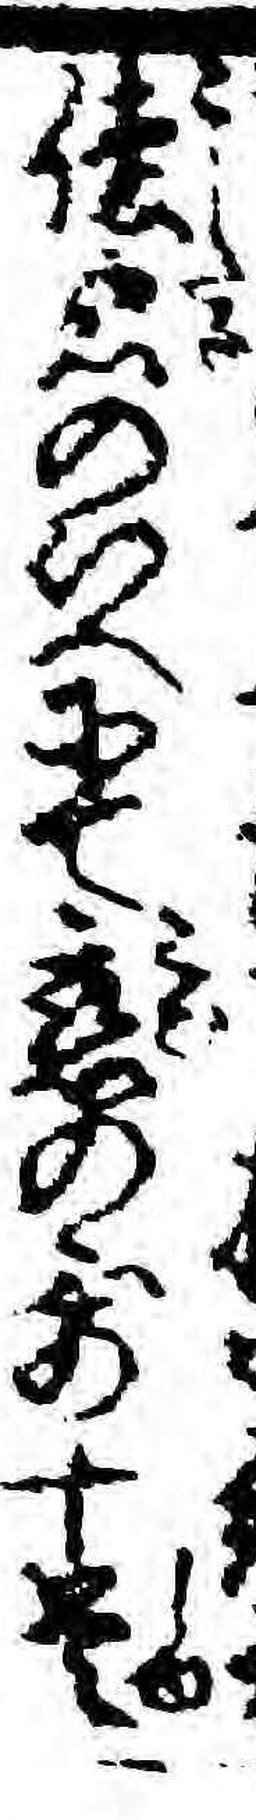俊忠のいへにて恋の哥十首
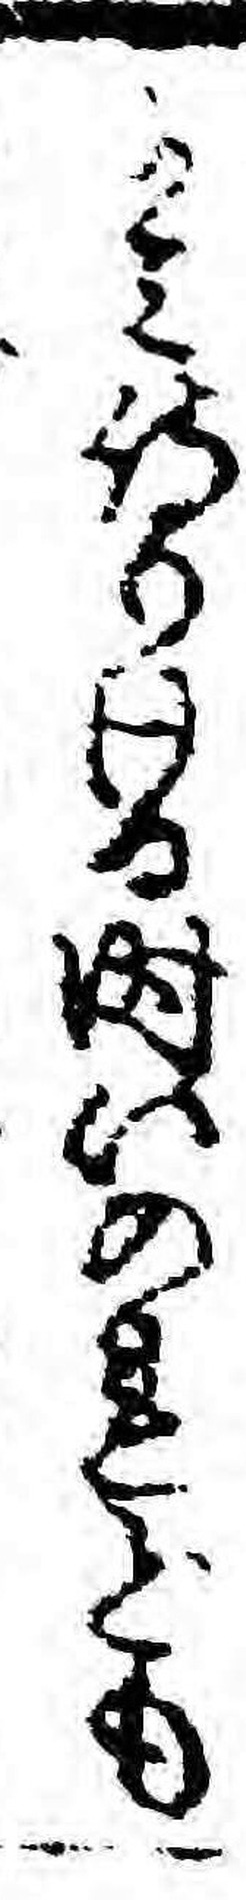よみ侍りける時いのれども
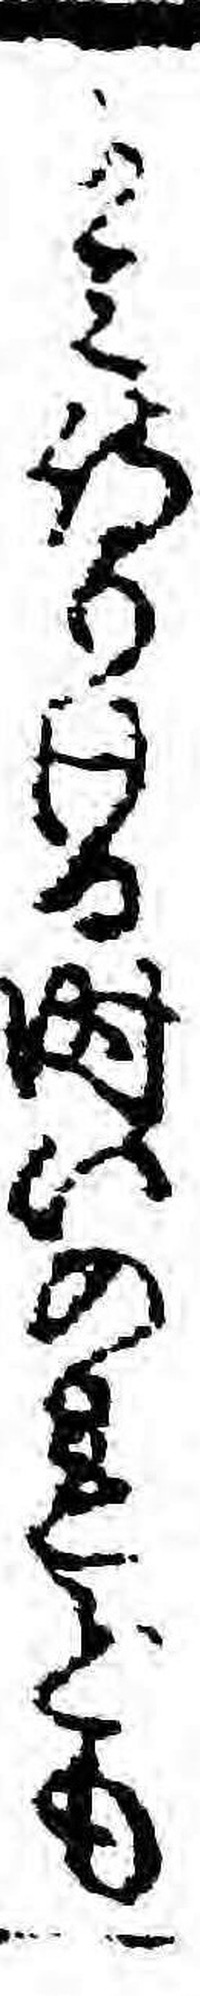よみ侍りける時いのれども
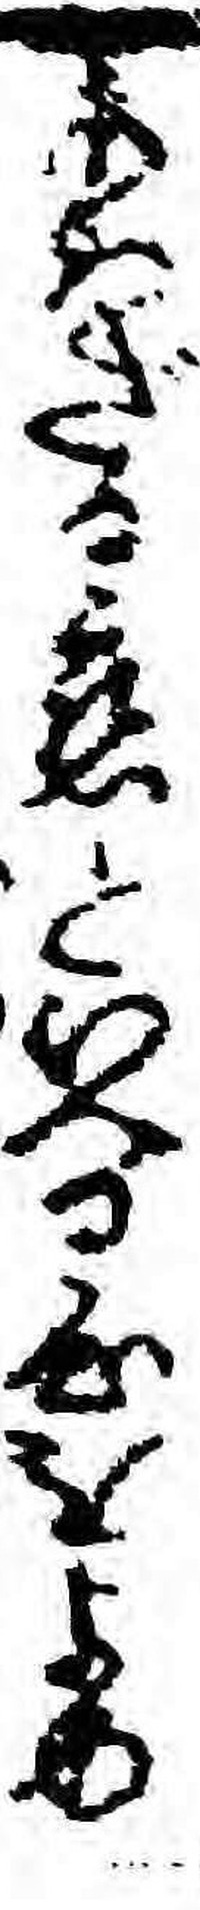あはざる恋といへる心をよめ
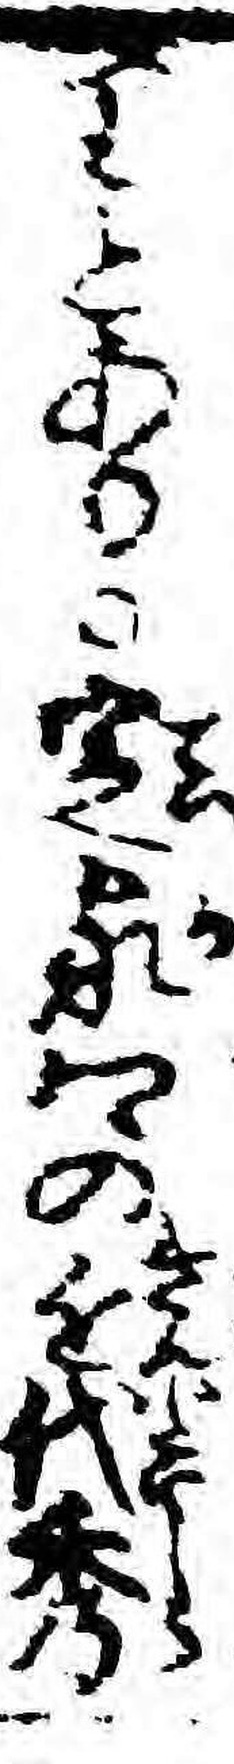りとあり〇定家卿の近代秀
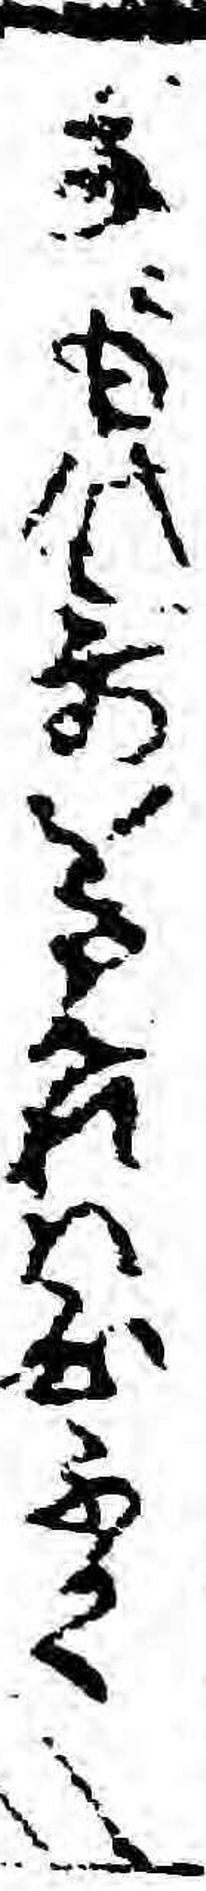歌にも此哥を見れは心ふかく
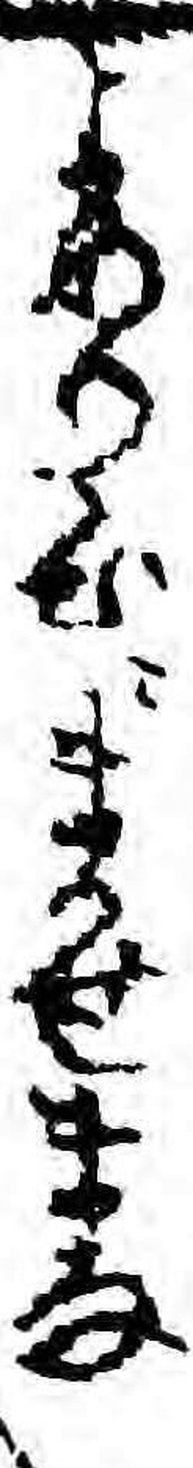よめり心にまかせまな
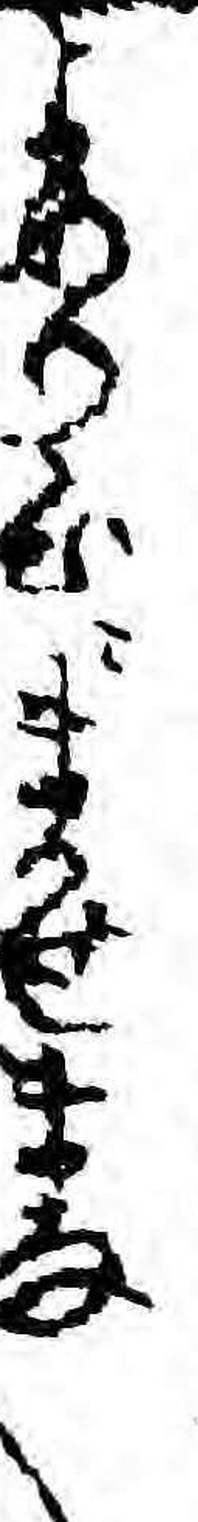よめり心にまかせまな
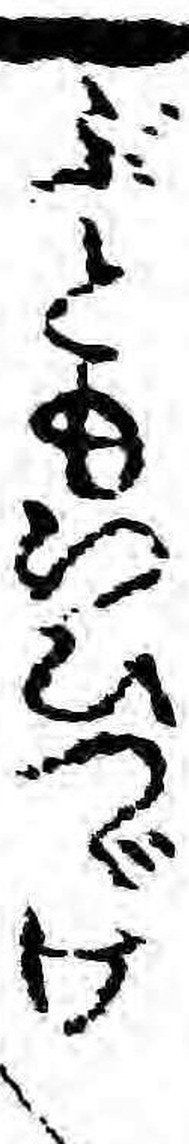ぶともいひつゞけ
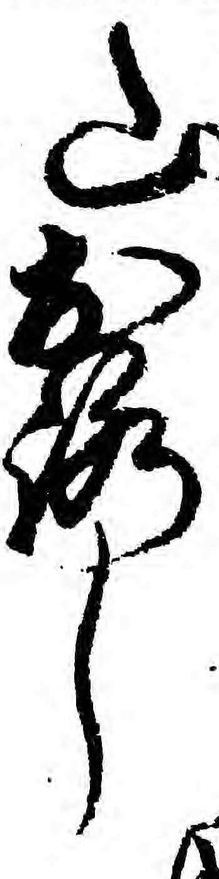山おろし
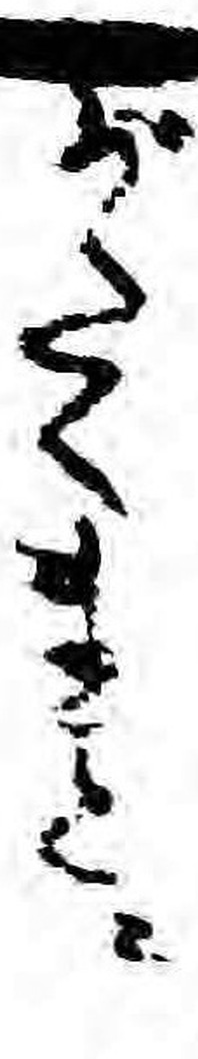がたくまことに
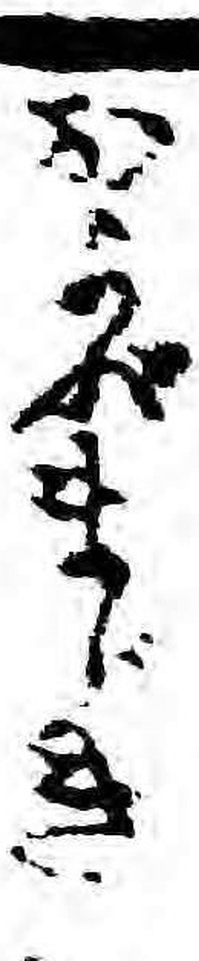およぶまじき
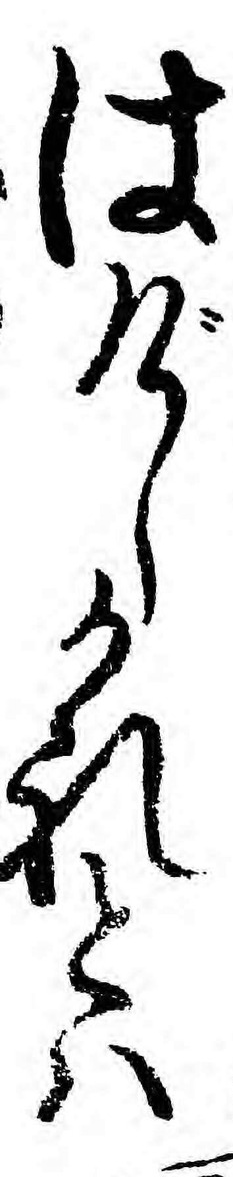はげしかれとは
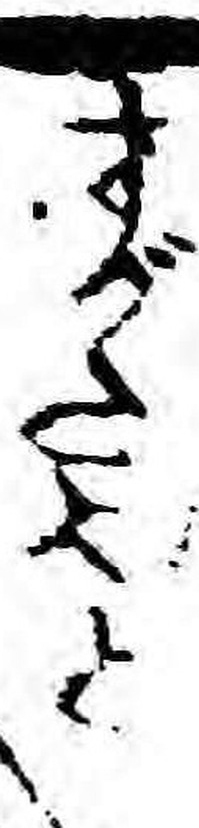すがた也と
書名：頭書和歌注譯／壽賀多百人一首小倉錦
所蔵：国文学研究資料館
